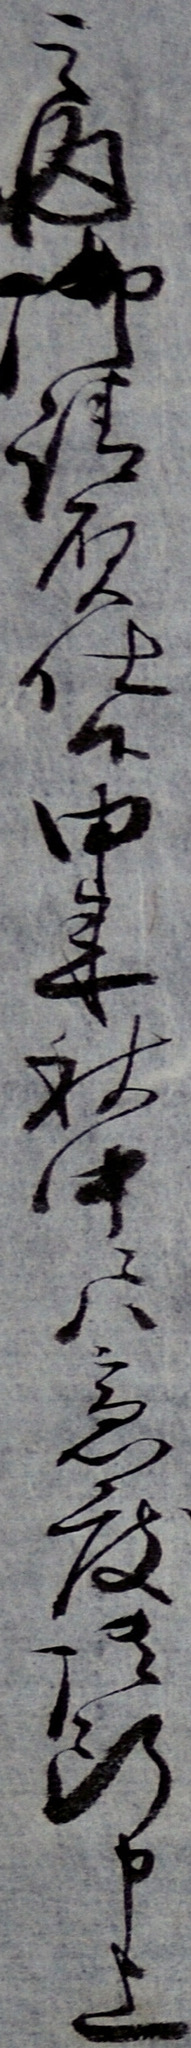之内御請負仕候申年秋中ニハ急度御断申上

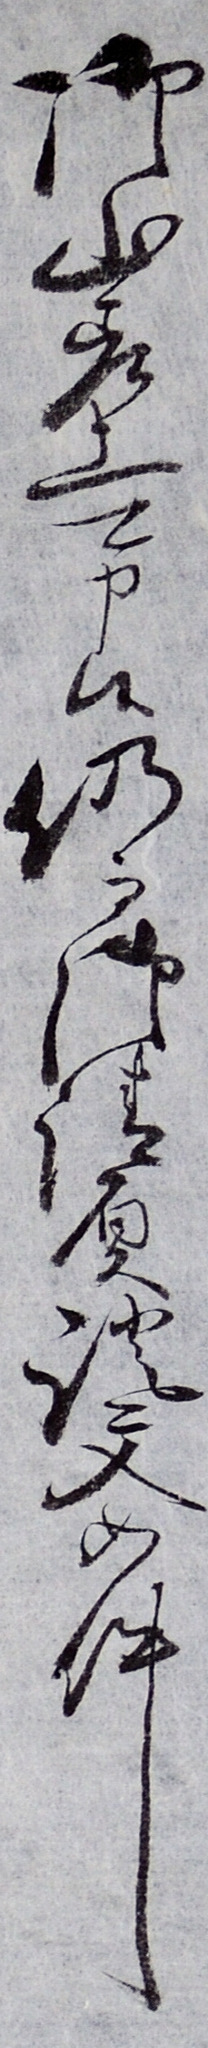御山差上可申候仍而御請負証文如件
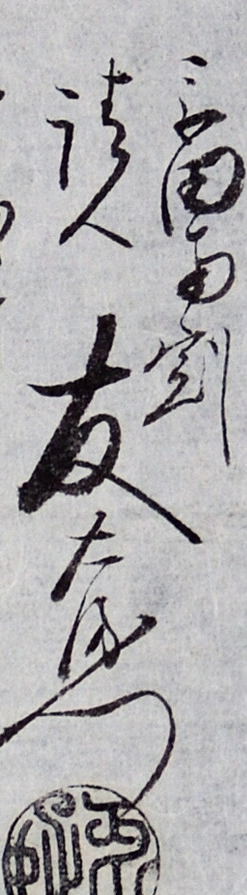請人友右衛門㊞
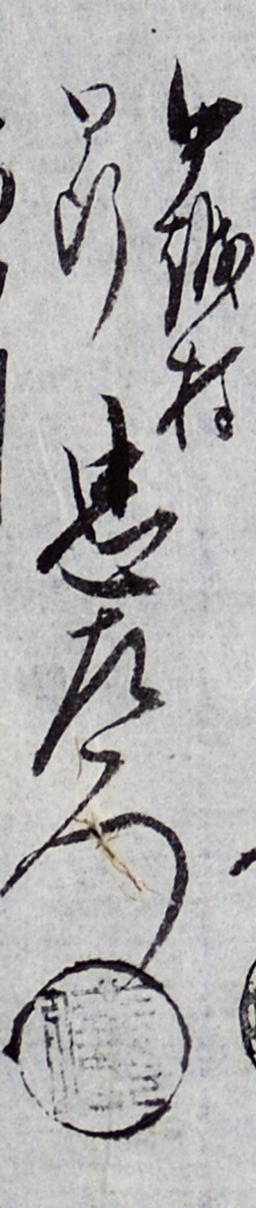同断忠左衛門㊞
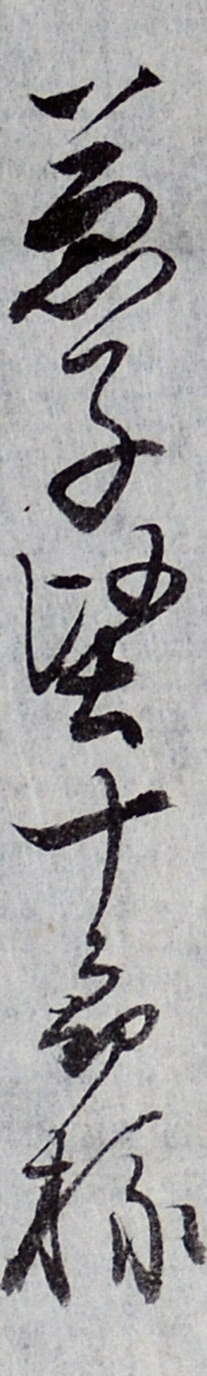兼子堅十郎様
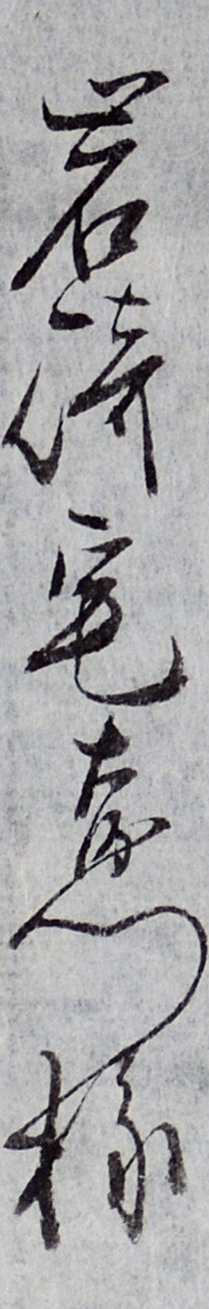岩崎宅右衛門様
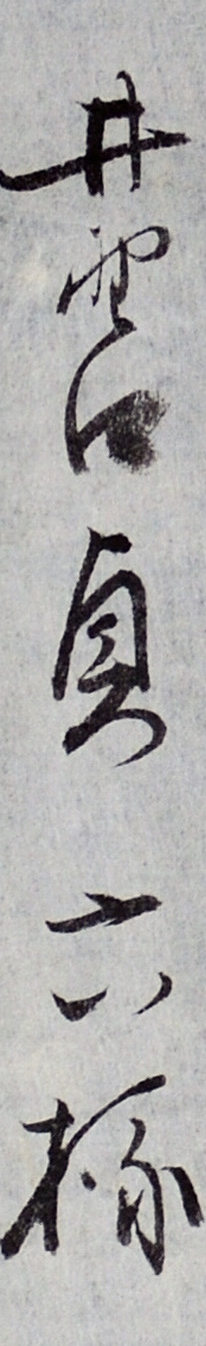井野口貞六様
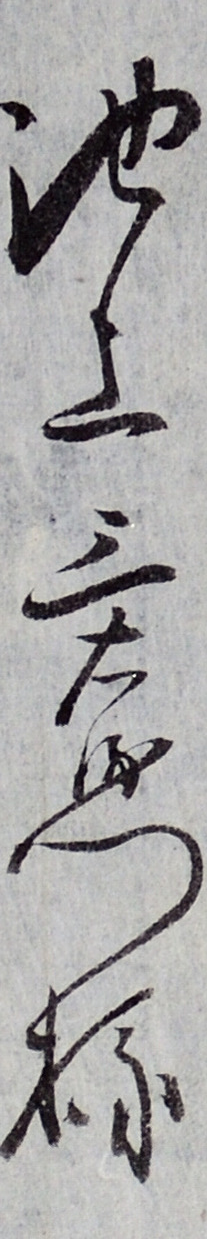池上三右衛門様
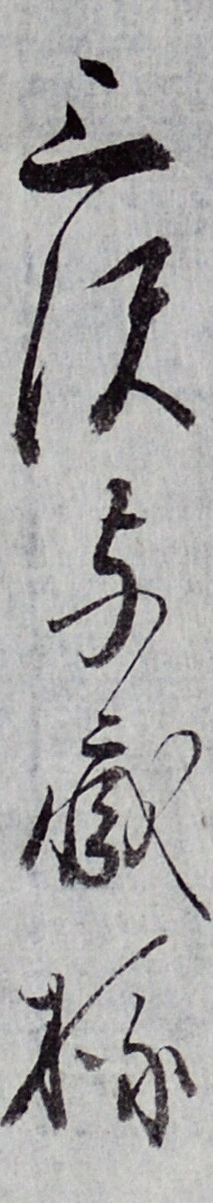三沢与蔵様
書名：一札之事
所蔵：伊那市立高遠町図書館・合同会社AMANE
